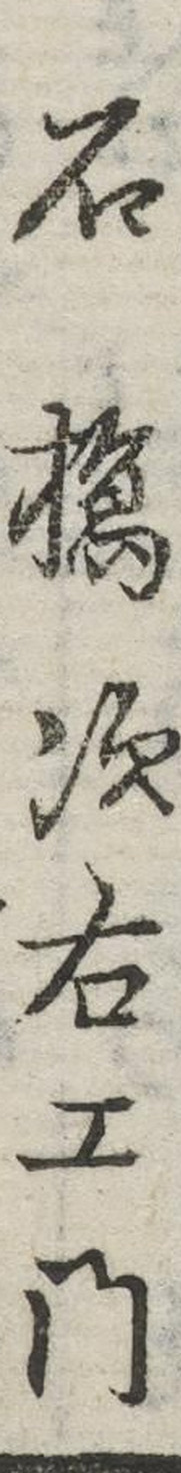石橋次右衛門
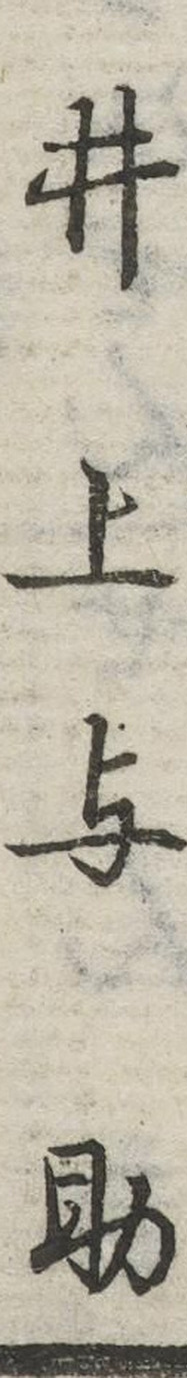井上与助

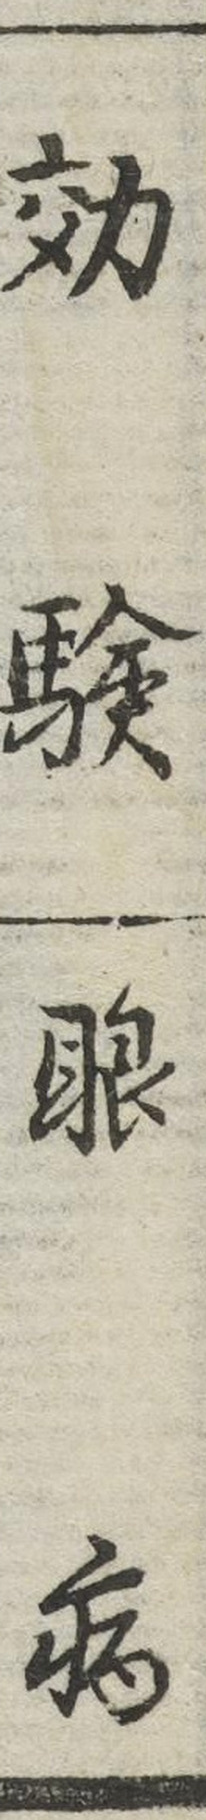功験眼病
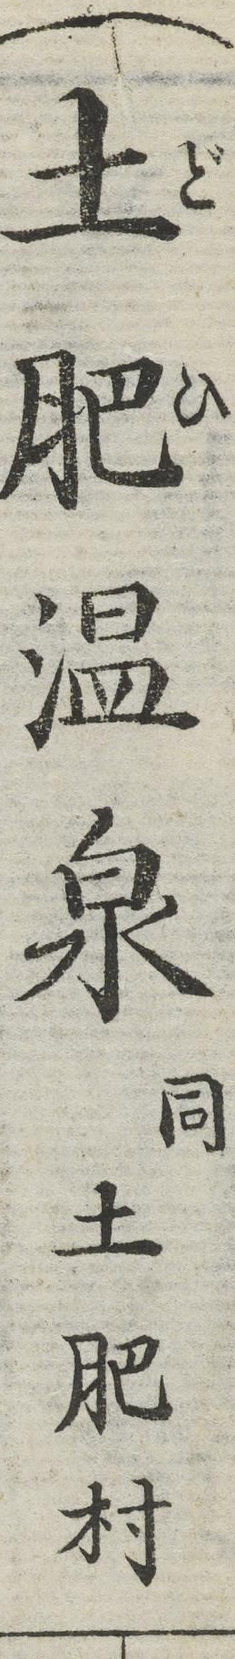土肥温泉同土肥村
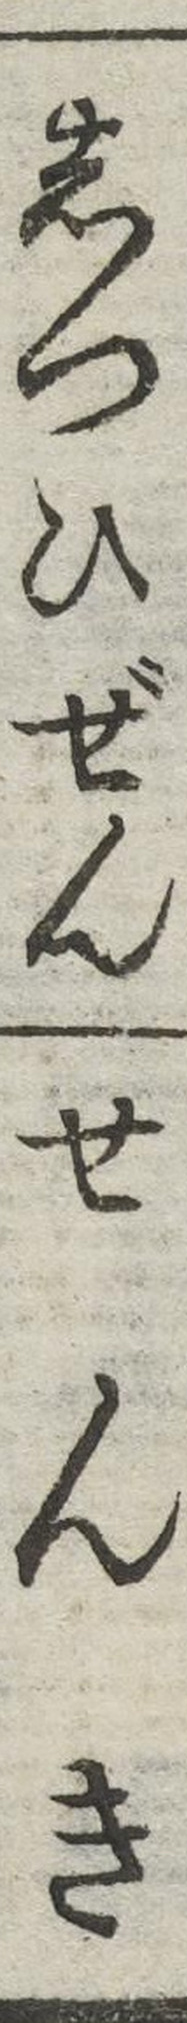しつひぜんせんき
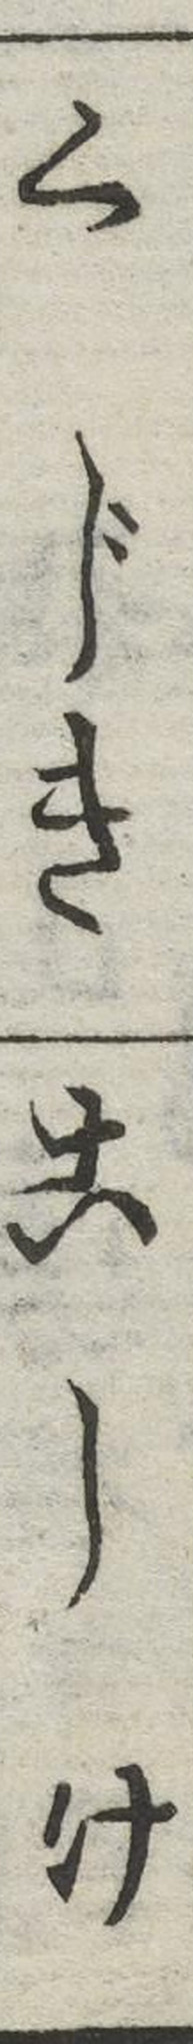くじきこしけ
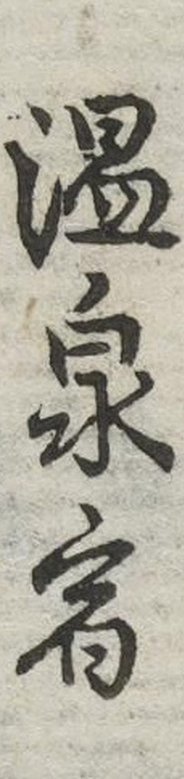温泉宿
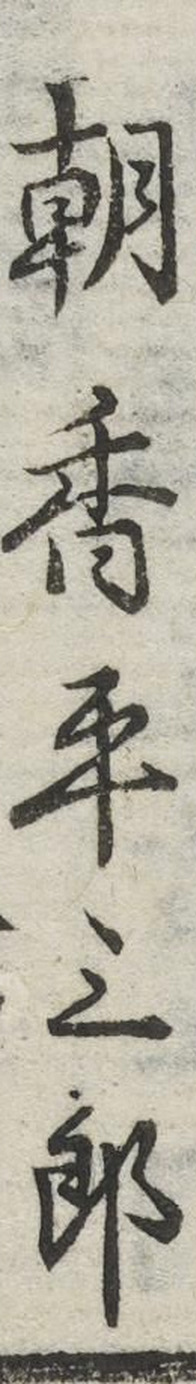朝香半三郎
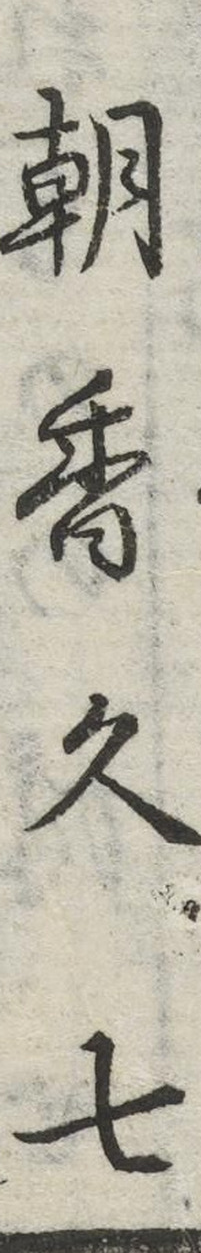朝香久七
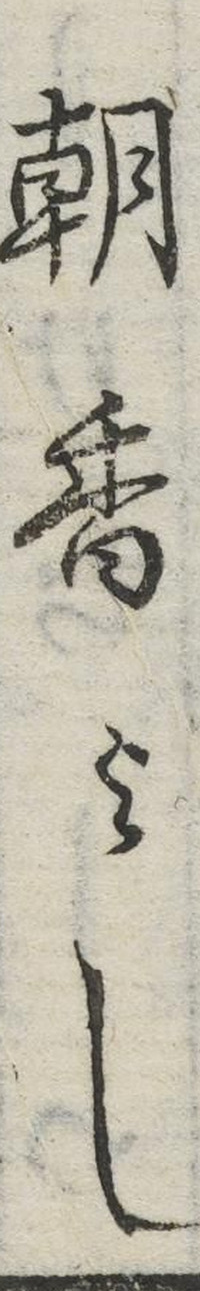朝香よし
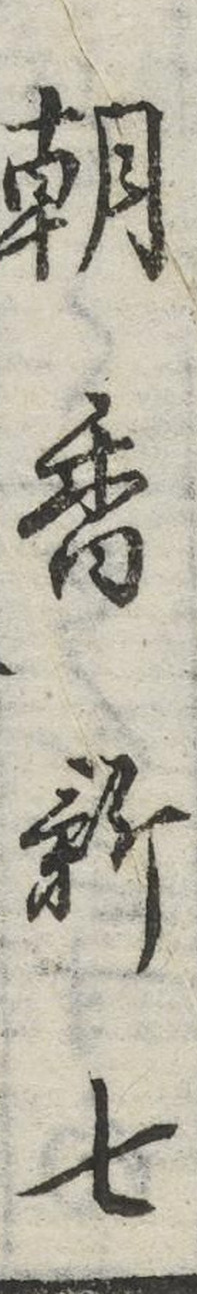朝香新七
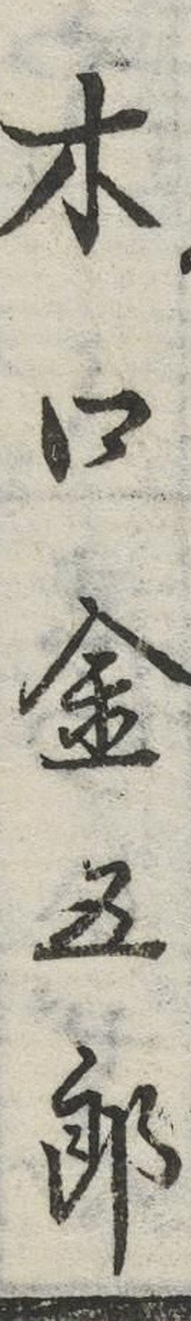木口金五郎
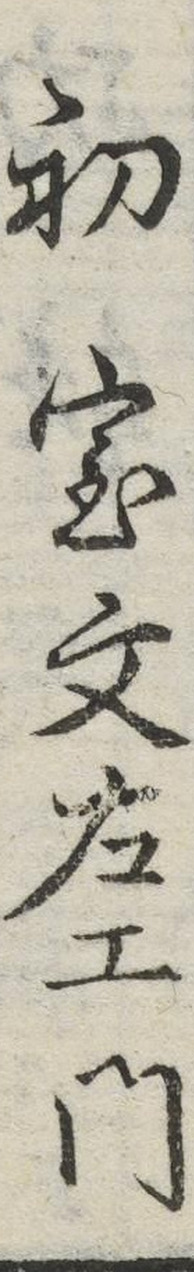初宝文左衛門
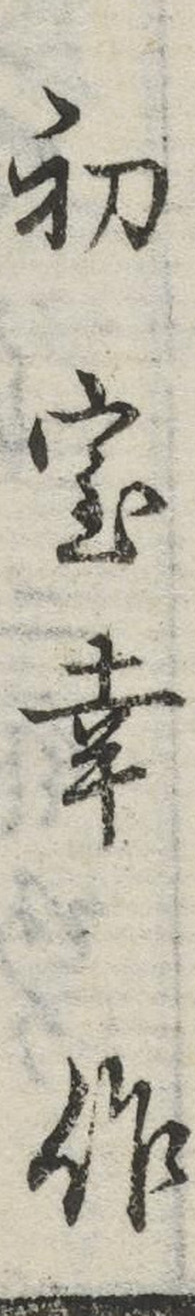初宝幸作
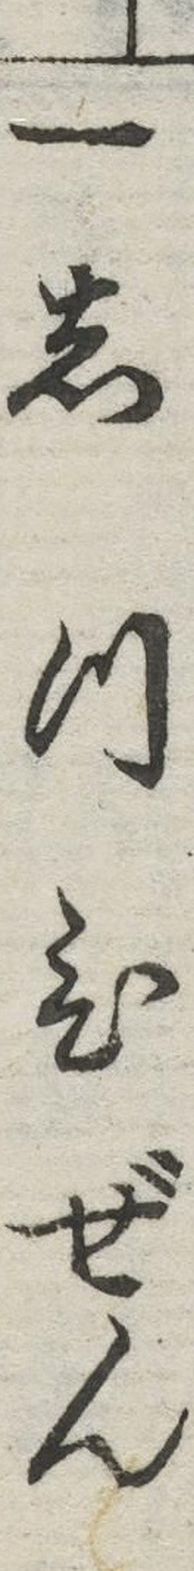一しつひぜん
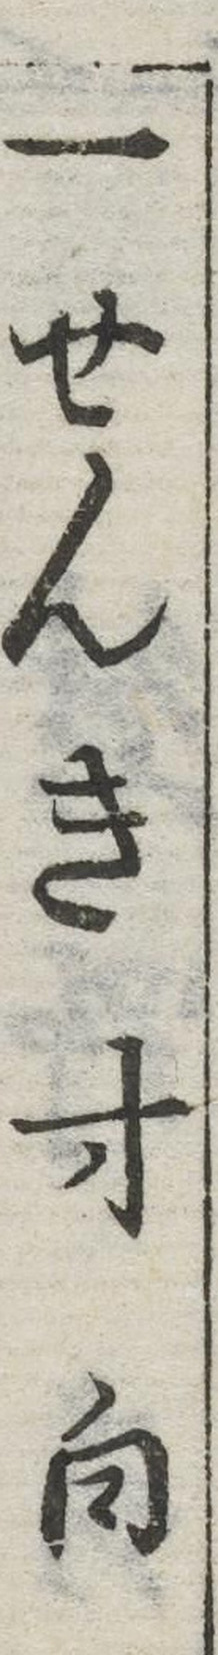一せんき寸白
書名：諸國温泉遊覽記　全
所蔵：東京大学地震研究所図書室 Earthquake Research Institute Library, The University of Tokyo, JAPAN
